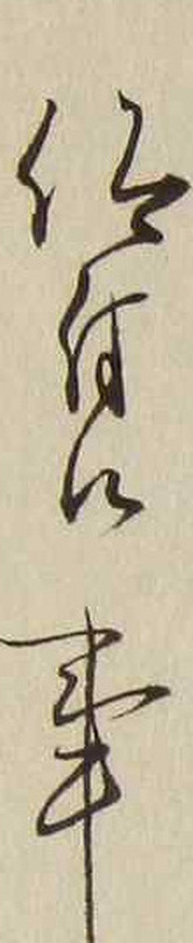仰付候事

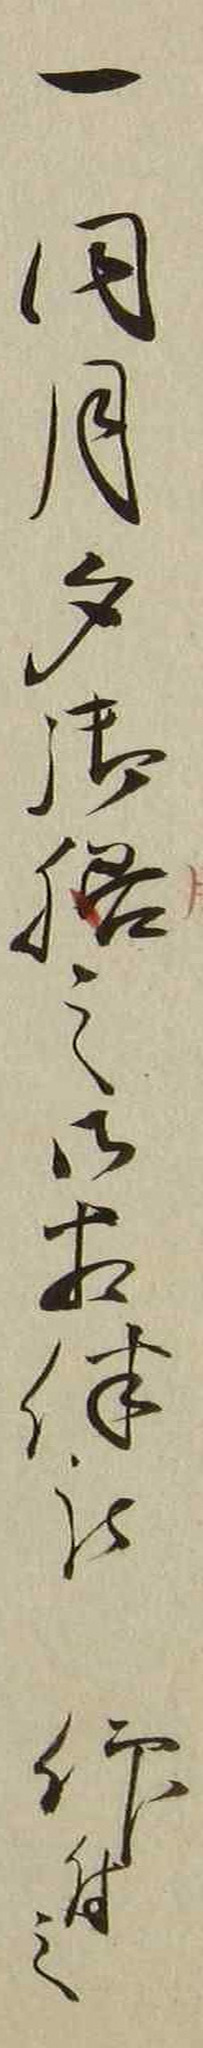一同月夕御膳之御相伴被仰付之
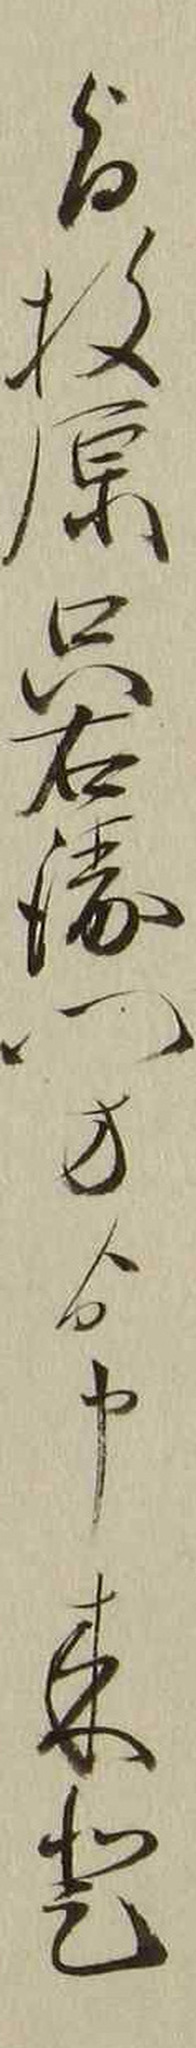旨枚原只右衛門方ゟ申来登
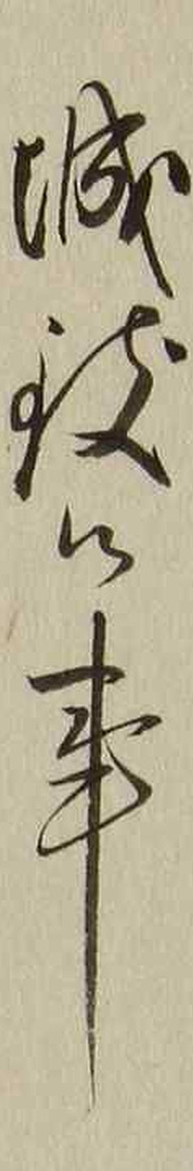城致候事
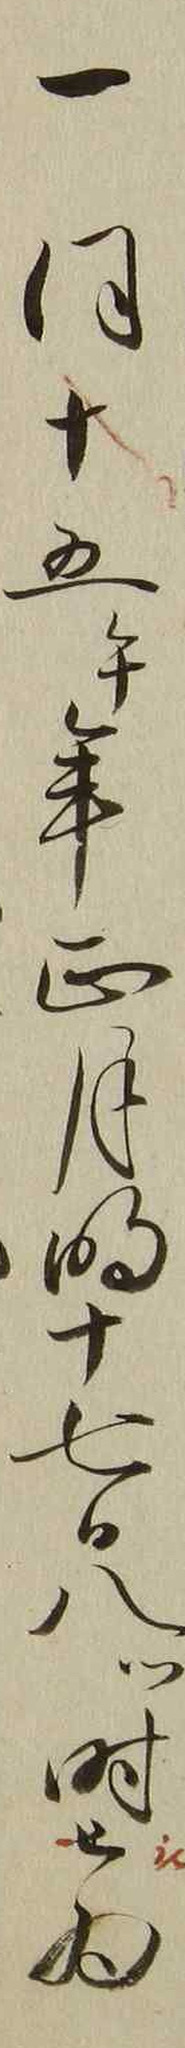一同十五午年正月明十七日八つ時七為
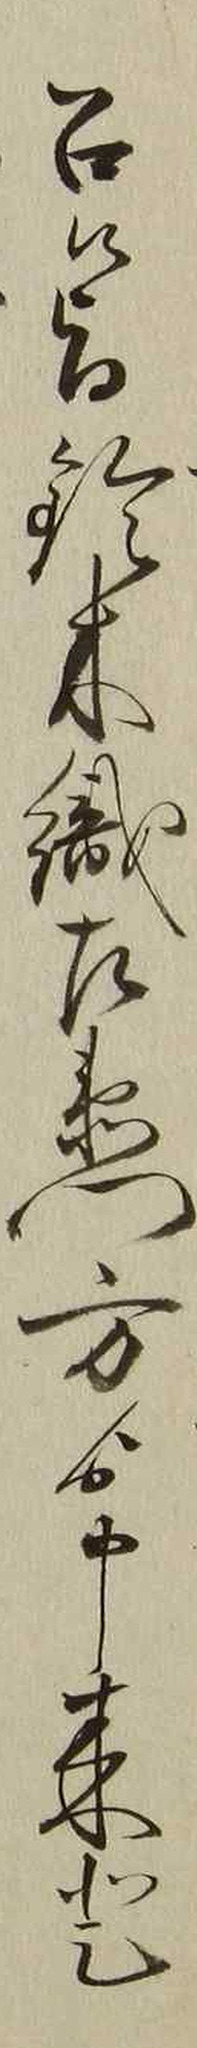召候旨鈴木織左衛門方ゟ申来登
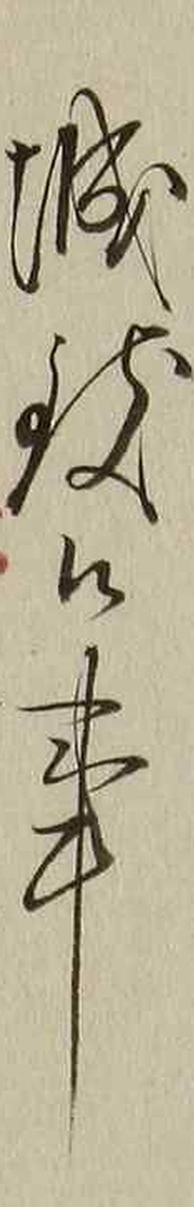城致候事
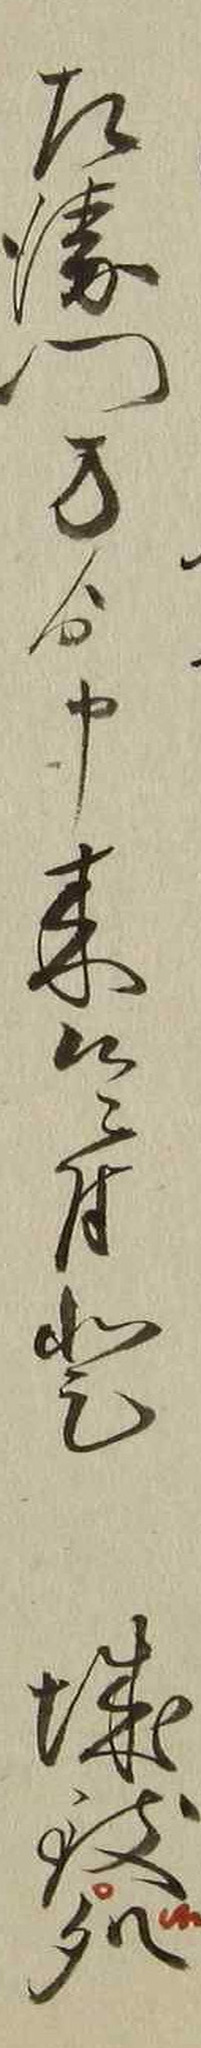左衛門方ゟ申来候に付登城致候処
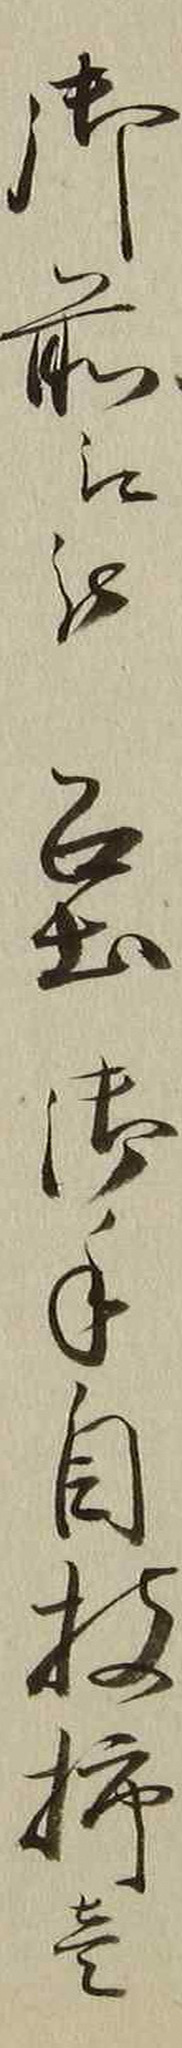御前江被召出御手自枝柿壱
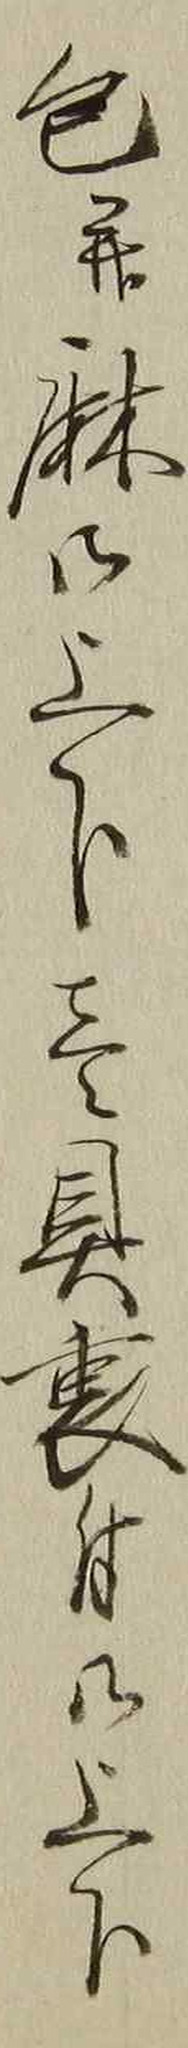包并麻御上下壱具裏付御上下
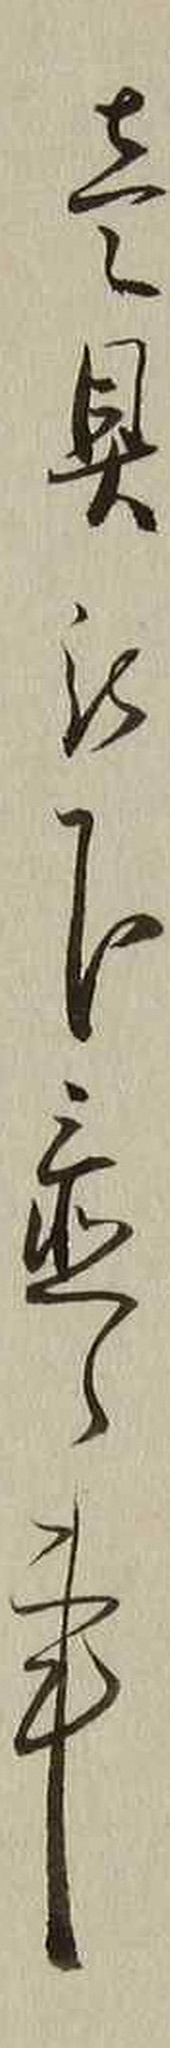壱具被下置候事
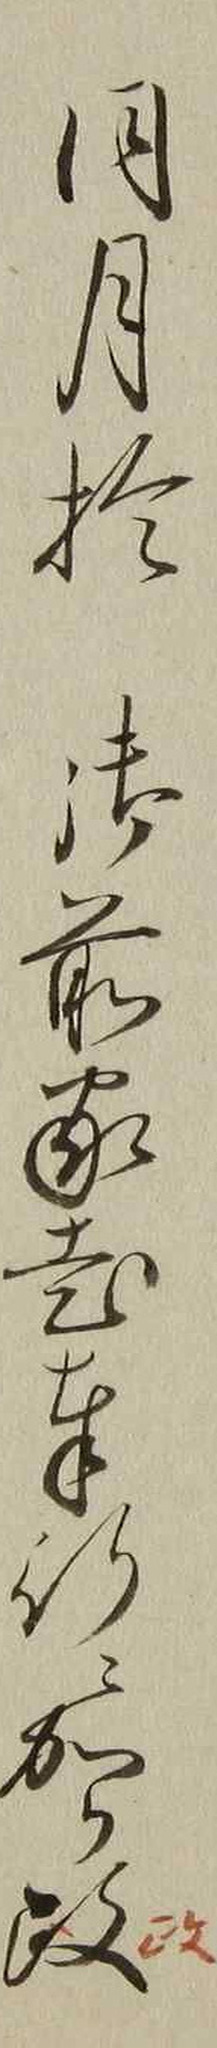一同月於御前家老奉行に加り改
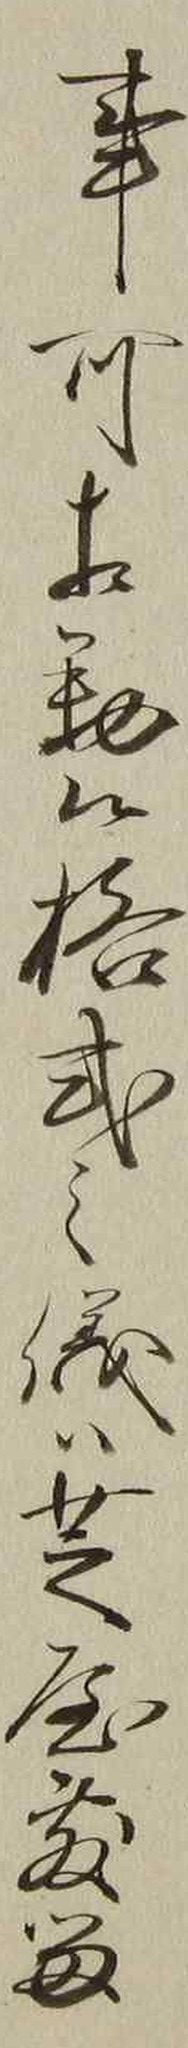事可相勤候格或之儀は芝屋敷留
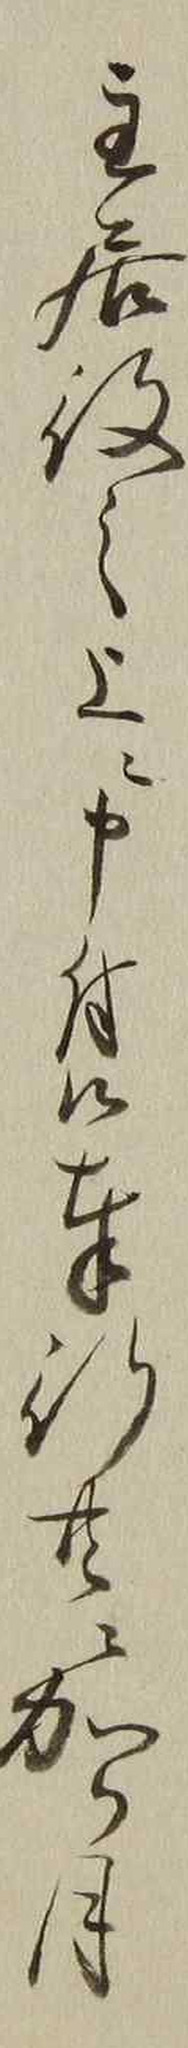主居役之上に申付侯奉行共に加り月
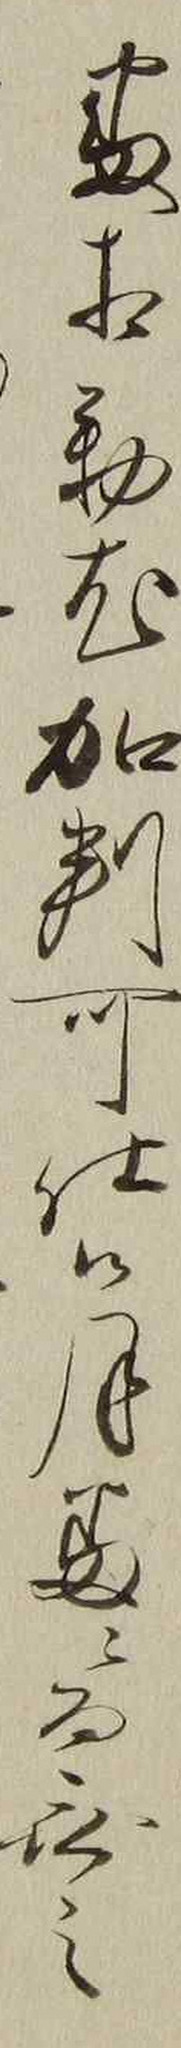番相勤尤加判可仕候月番に而在之
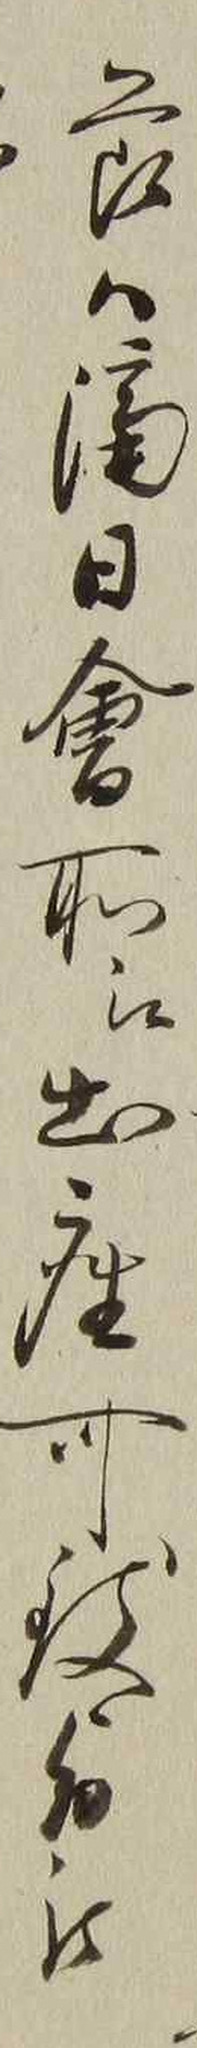節は隔日会所江出座可致旨被
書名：諸士系譜　巻之103　か之部11
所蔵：会津若松市立会津図書館
